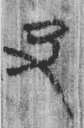夬（慧）
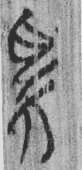奚（奚）
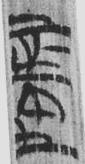{帝止}（適）
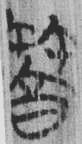○（孰）
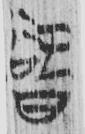智（知）
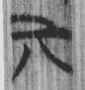亓（其）
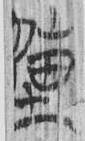疆
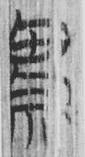○（鬼）
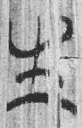生
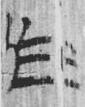於
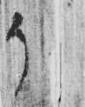人
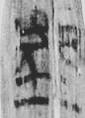○（吾）
